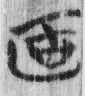固
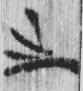之
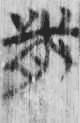歲（歲）
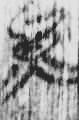○（爨）
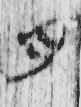月
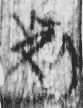死
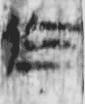於
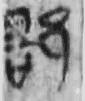敢
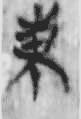東
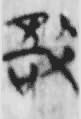敔
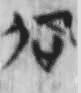卲
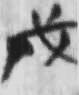戊
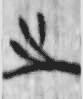之
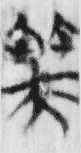○（簠）
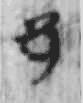邑
